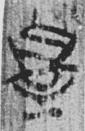辠（罪）
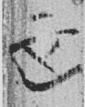正（政）
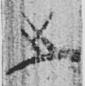之
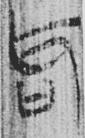○（始）
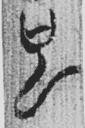也
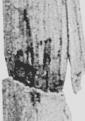中（仲）
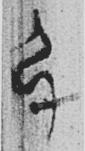弓
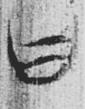曰
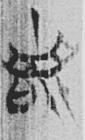若
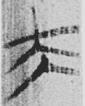夫
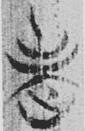老老
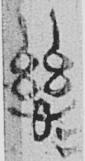慈
